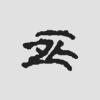恆
